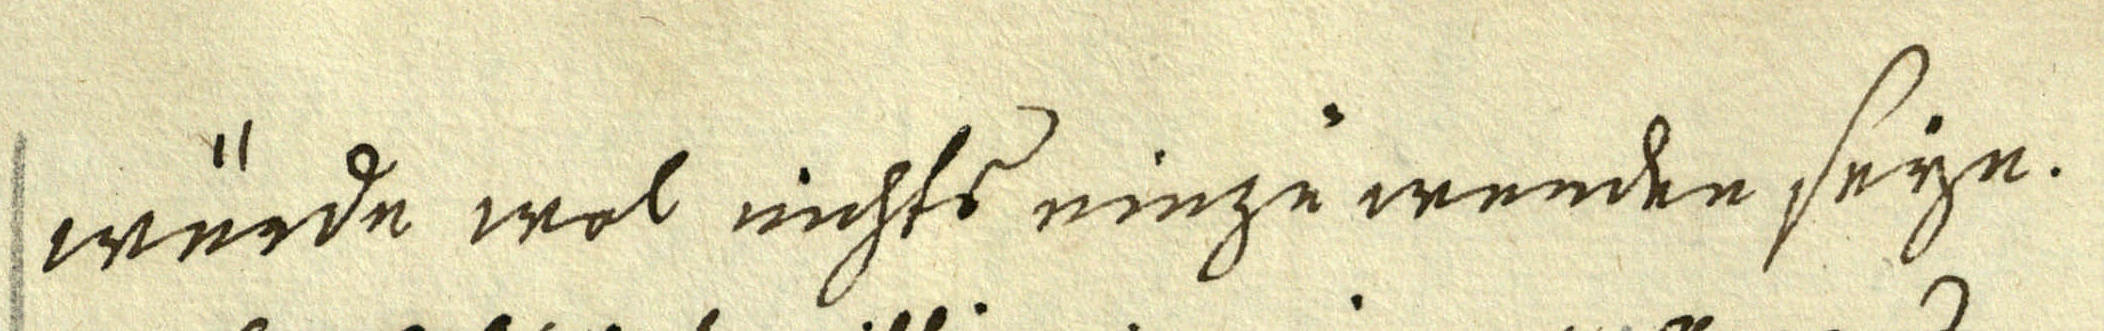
würde wol nichts einzuwenden seÿn.
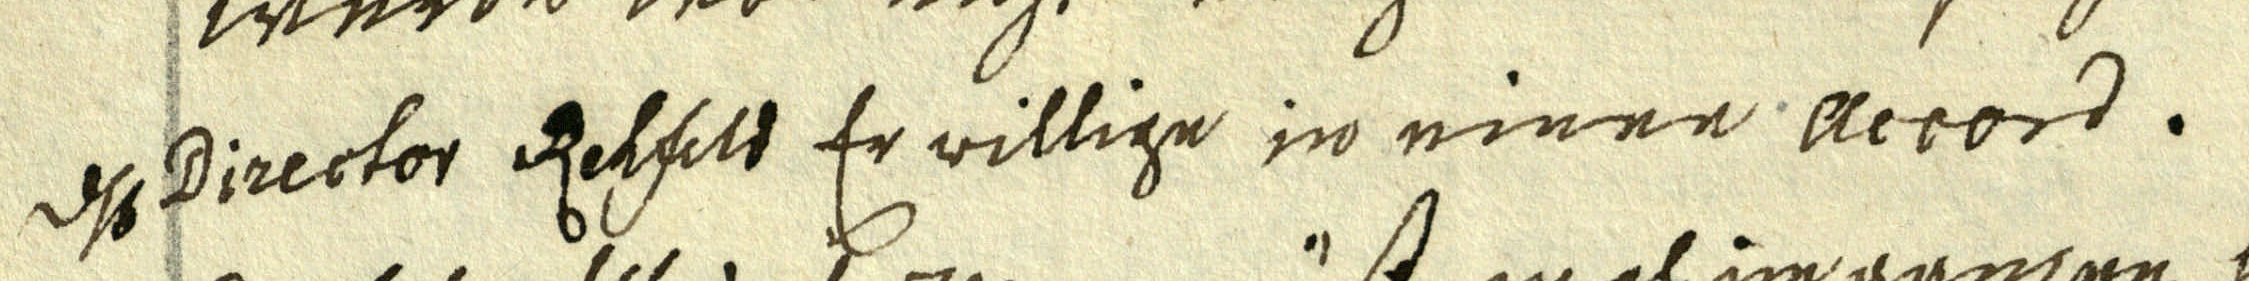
dh. Director Rehfeld Er willige in einen Accord.
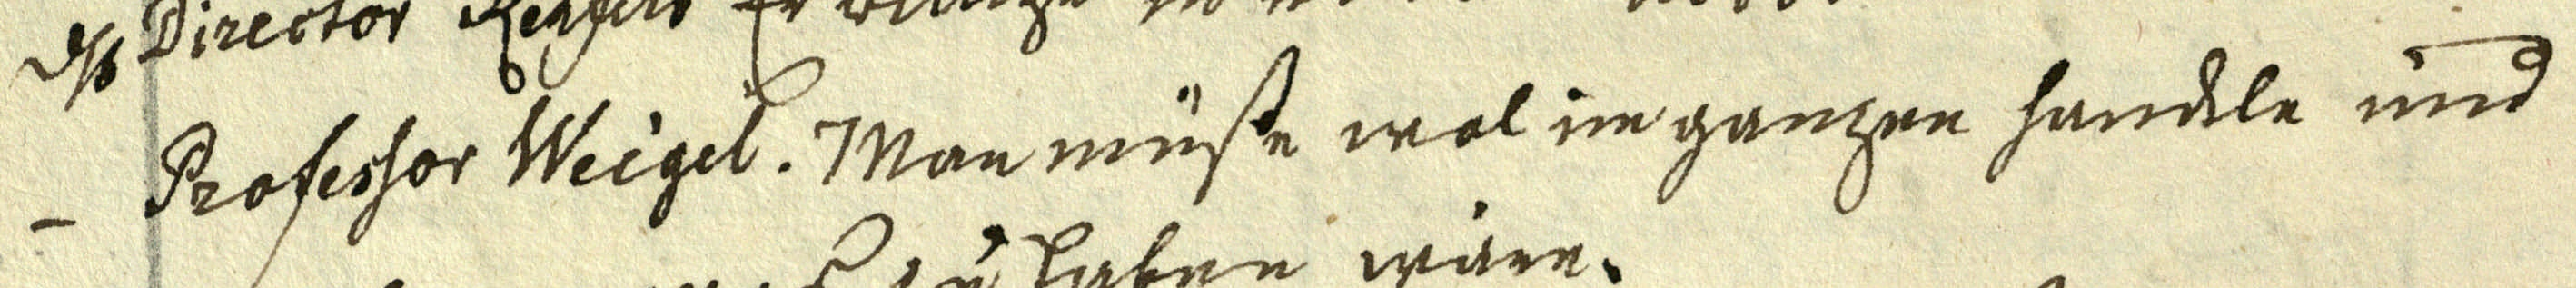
Professor Weigel. Man müße wol im ganzen handeln und
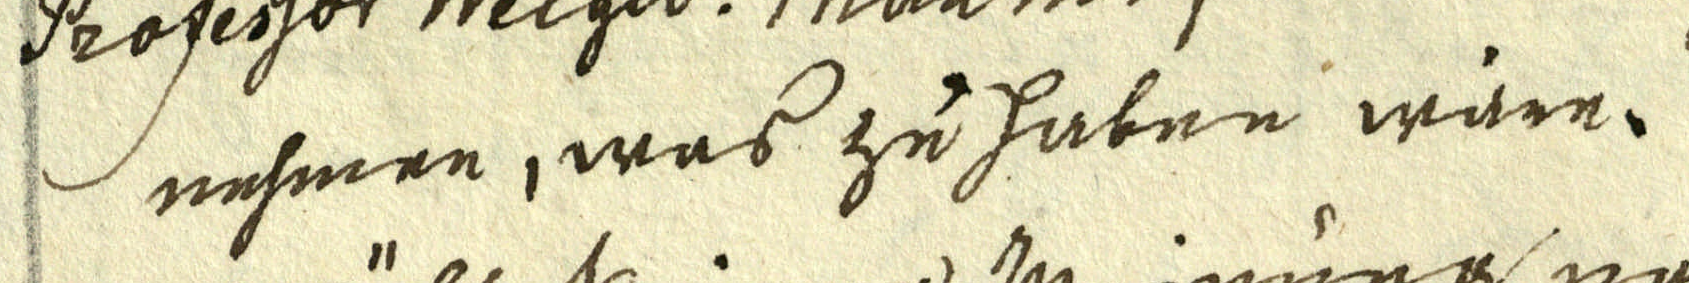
nehmen, was zu haben wäre.
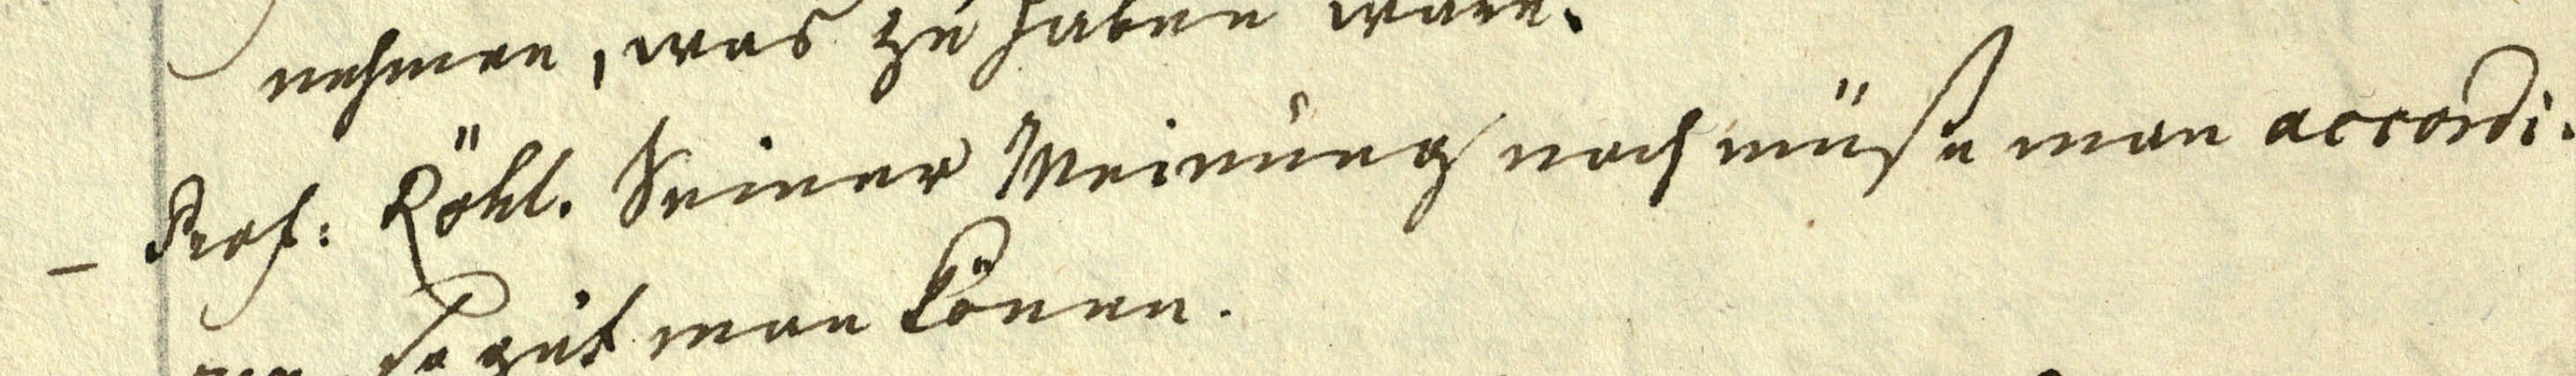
Prof. Röhl. Seiner Meinung nach müße man accordi¬
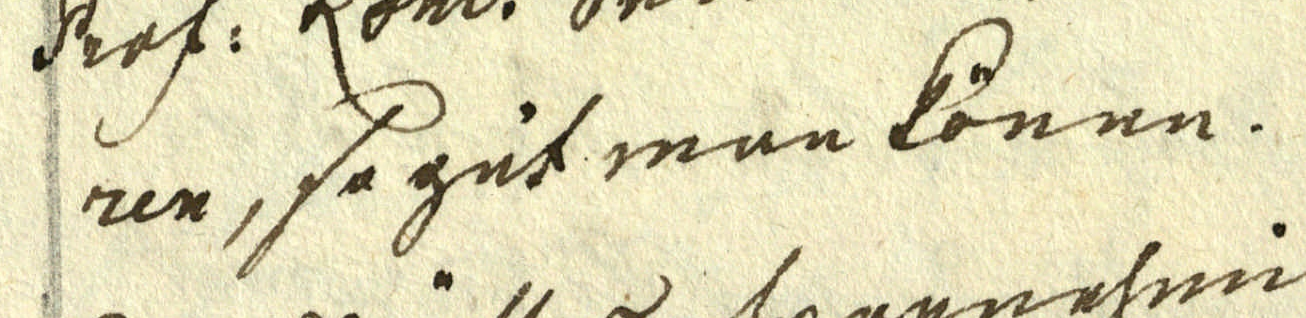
ren, so gut man könne.
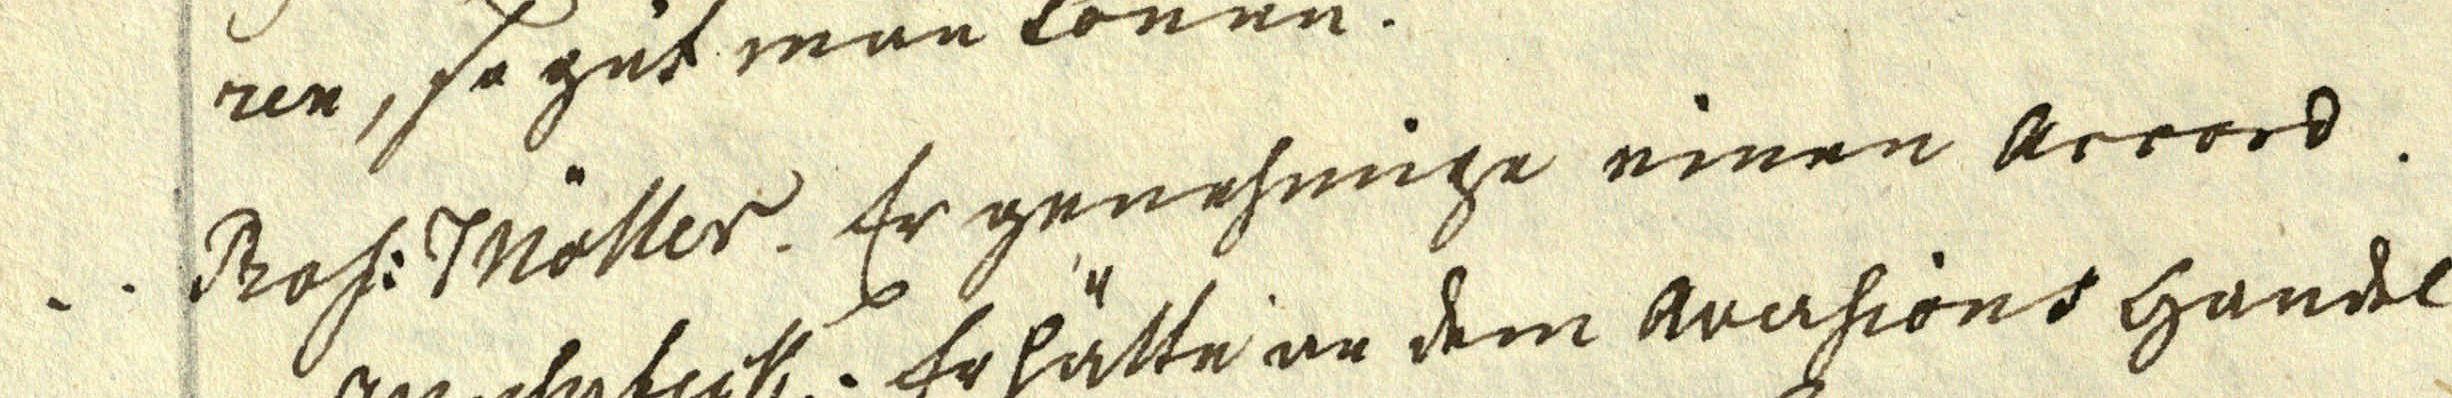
Prof. Möller. Er genehmige einen Accord.
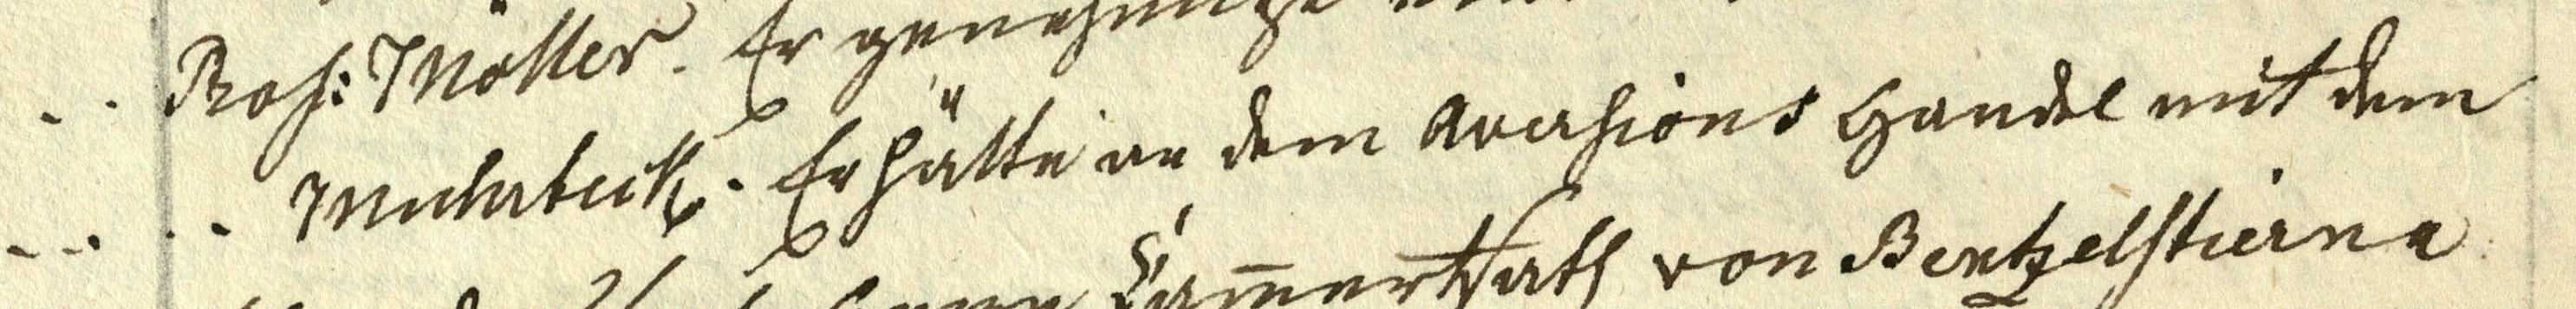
Muhrbeck. Er hätte an dem Aversions Handel mit dem
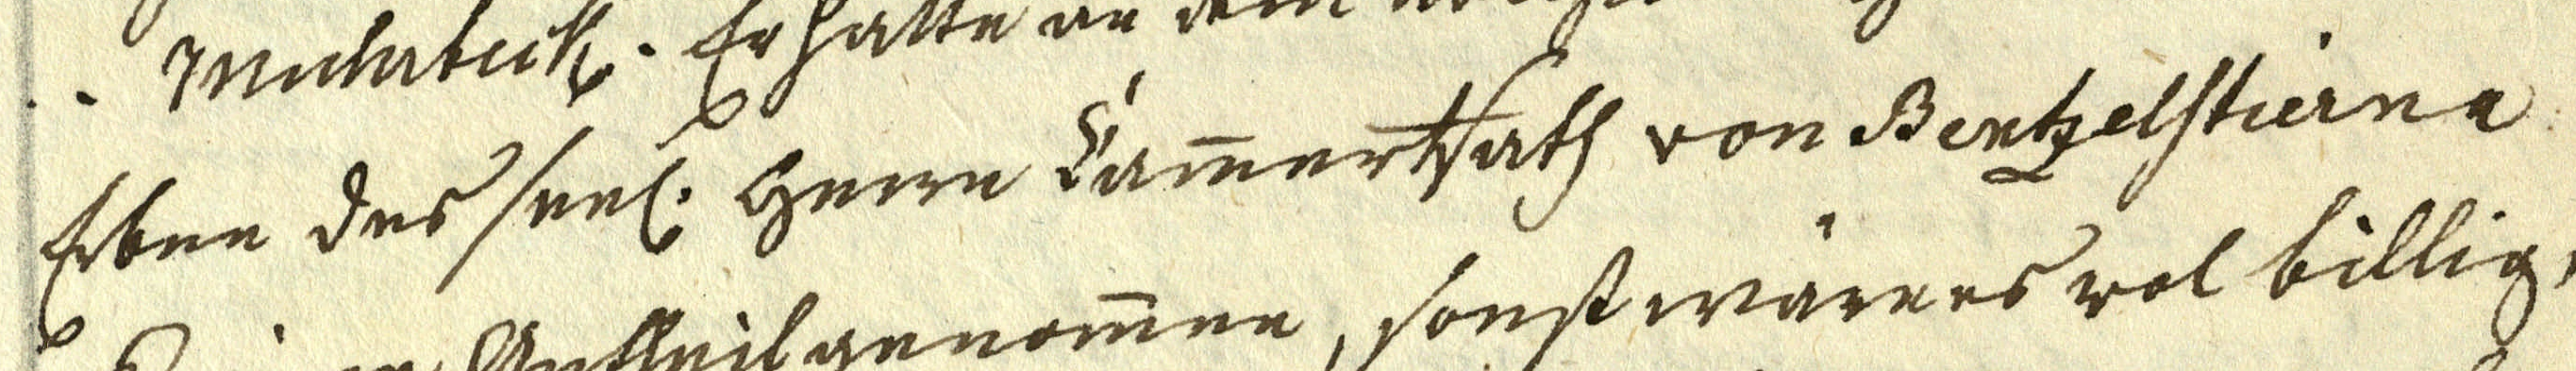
Erben des seel. Herrn CamerRath von Bentzelstierna
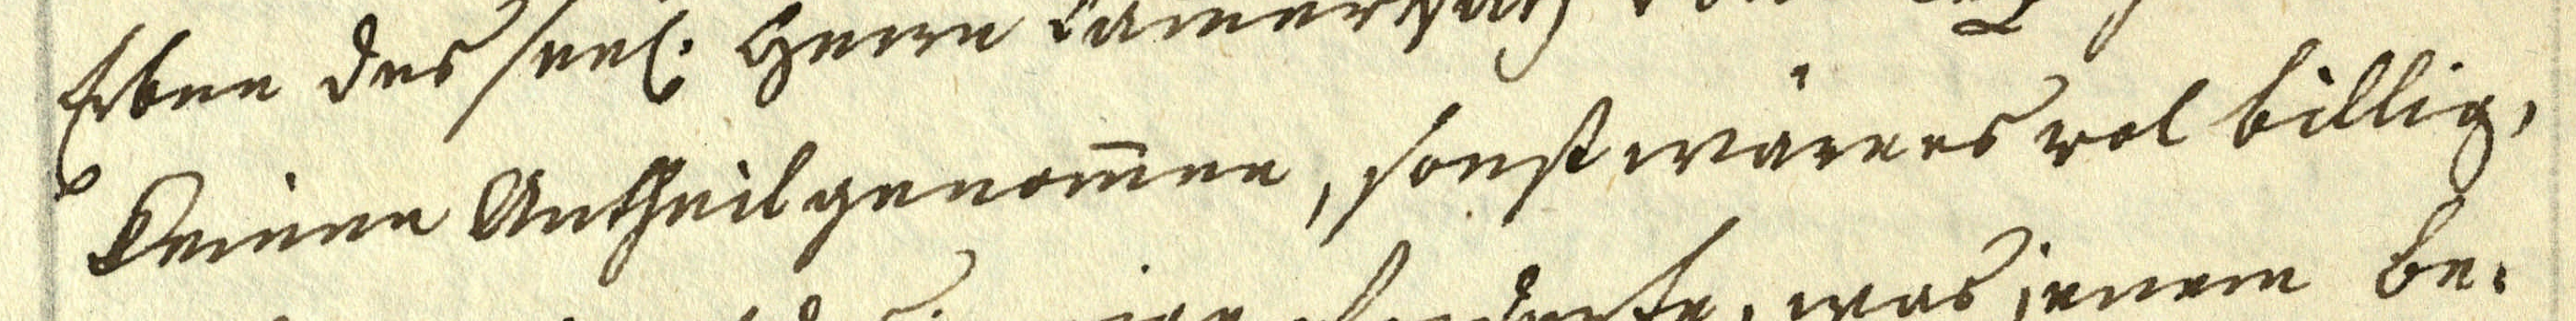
keinen Antheil genomen, sonst wäre es wol billig,
